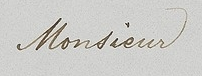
Monsieur
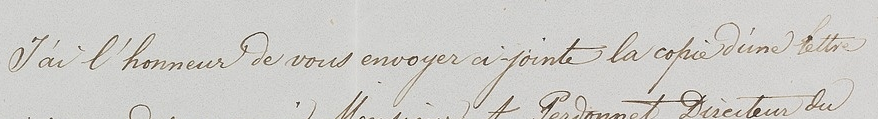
J'ai l'honneur de vous envoyer ci-jointe la copie d'une lettre
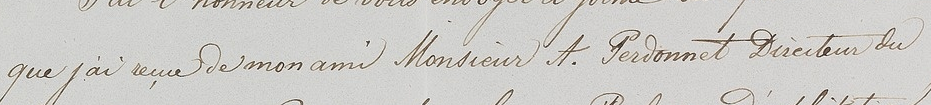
que j'ai reçue de mon ami Monsieur A. Perdonnet Directeur du
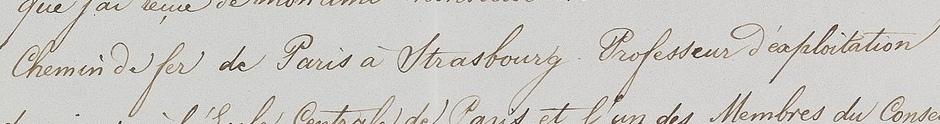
Chemin de fer de Paris à Strasbourg, Professeur d'exploitation
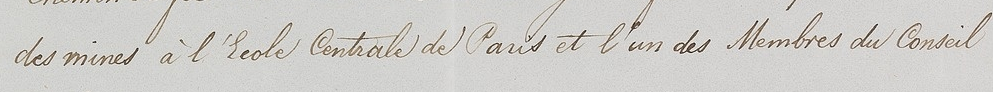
des mines à l'Ecole Centrale de Paris et l'un des Membres du Conseil
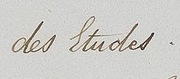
des Etudes.
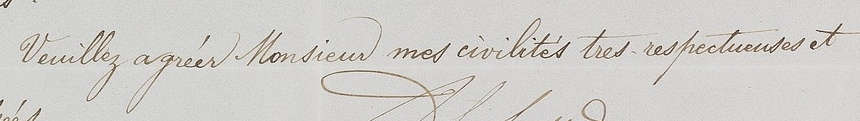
Veuillez agréer Monsieur mes civilités très respecteuses et
